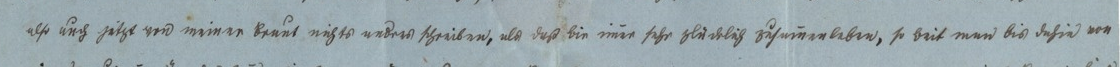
also auch jetzt von meiner Braut nichts andres schreiben, als daß wir immer sehr glücklich zusammenleben, so weit man bis dahin von
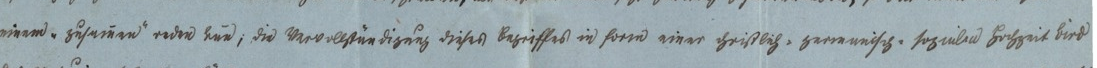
einem «zusammen» reden kann; die Vervollständigung dieses Begriffes in Form einer christlich-germanisch-sozialen Hochzeit wird
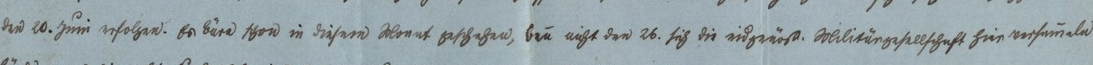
den 20. Juni erfolgen. Es wäre schon in diesem Monat geschehen, wenn nicht den 26. sich die eidgenöss. Militärgesellschaft hier versammeln
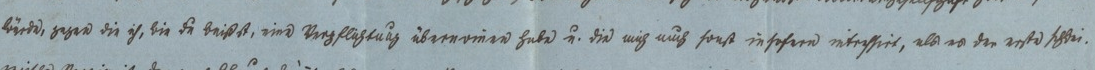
würde, gegen die ich, wie du weißst, eine Verpflichtung übernommen habe u. die mich auch sonst insofern intressirt, als es der erste schwei-
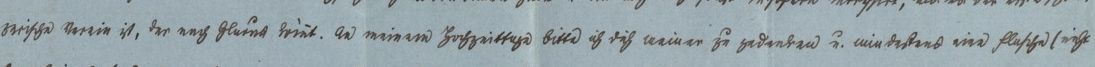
zerische Verein ist, der nach Glarus kömmt. An meinem Hochzeittage bitte ich dich meiner zu gedenken u. mindestens eine Flasche (nicht
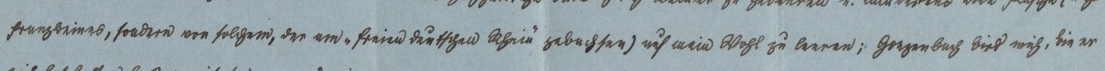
Franzweines, sondern von solchem, der am «freien deutschenRhein» gewachsen) auf mein Wohl zu leeren; Gonzenbach wird mich, wie er
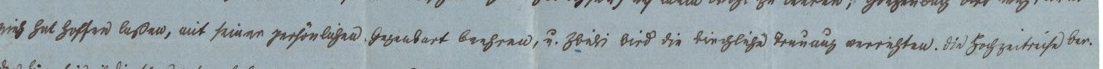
mich hat hoffen lassen, mit seiner persönlichen Gegenwart beehren, u. Zwicki wird die kirchliche Trauung verrichten. Die Hochzeitreise wer-
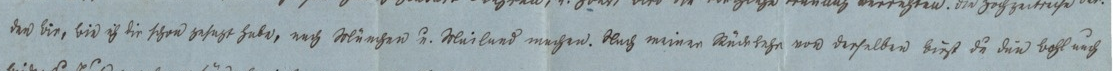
den wir, wie ich dir schon gesagt habe, nach München u. Mailand machen. Nach meiner Rückkehr von derselben wirst du dann wohl auch
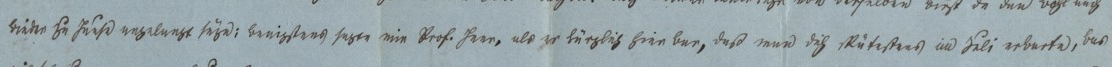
wieder zu Hause angelangt seyn; wenigstens sagte mir Prof. Heer, als er kürzlich hier war, daß man dich spätestens im Juli erwarte, was
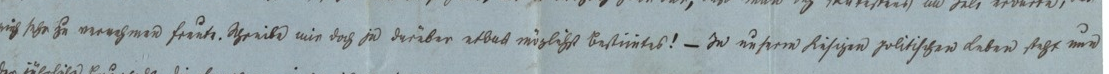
mich sehr zu vernehmen freute. Schreibe mir doch ja darüber etwas möglichst Bestimmtes! – In unserm hiesigen politischen Leben steht nun
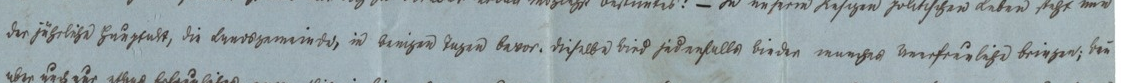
der jährliche Hauptakt, die Landsgemeinde, in wenigen Tagen bevor. Dieselbe wird jedenfalls wieder manches Unerfreuliches bringen; wenn
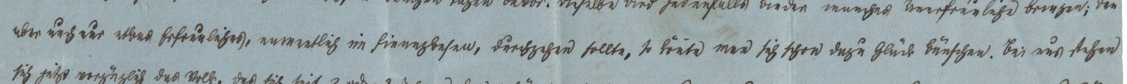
aber auch nur etwas Erfreuliches, namentlich im Finanzwesen, durchgehen sollte, so könnte man sich schon dazu Glück wünschen. Bei uns stehen
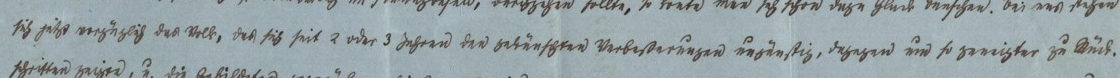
sich jetzt vorzüglich das Volk, das sich seit 2 oder 3 Jahren den gewünschten Verbesserungen ungünstig, dagegen um so geneigter zu Rück-
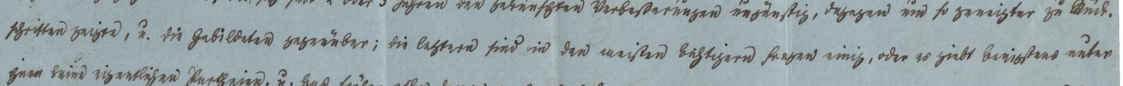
schritten zeigte, u. die Gebildeten gegenüber; die letztern sind in den meisten wichtigern Fragen einig, oder es giebt wenigstens unter
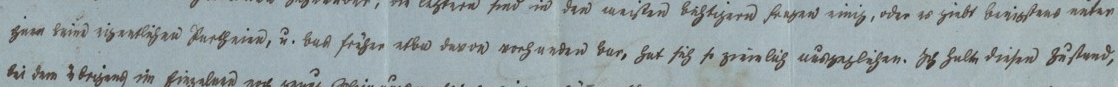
jenen keine eigentlichen Partheien, u. was früher etwa davon vorhanden war, hat sich so ziemlich ausgeglichen. Ich halte diesen Zustand,
